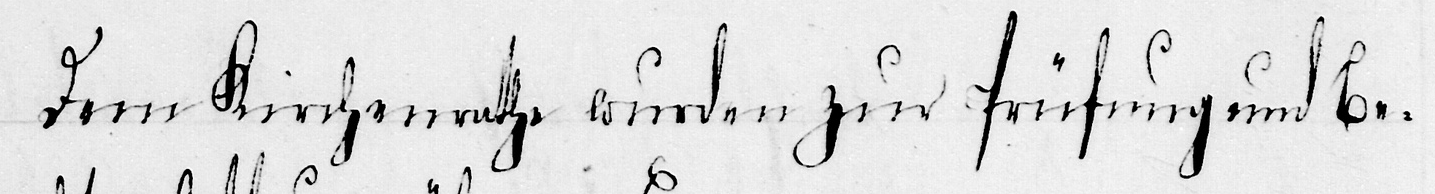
Dem Kirchenrathe wurden zur Prüfung und Be¬
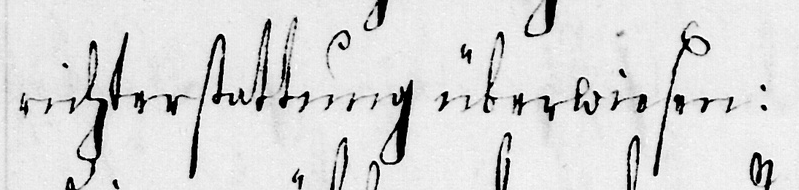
richterstattung überwiesen:
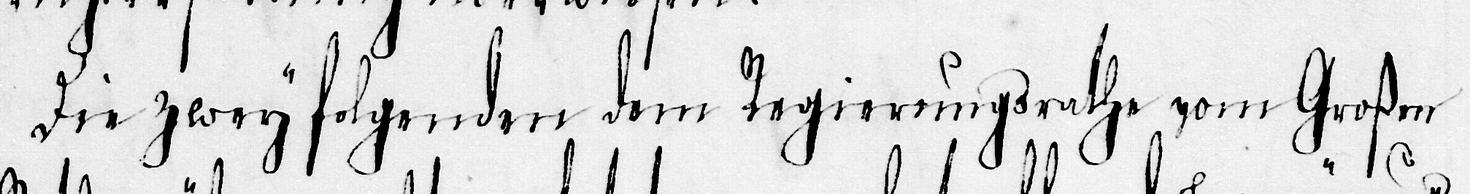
Die zwey folgenden dem Regierungsrathe vom Großen
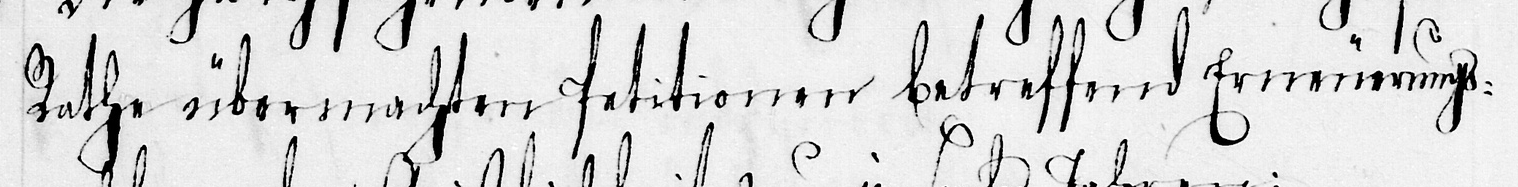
Rathe übermachten Petitionen betreffend Erneuerungs¬
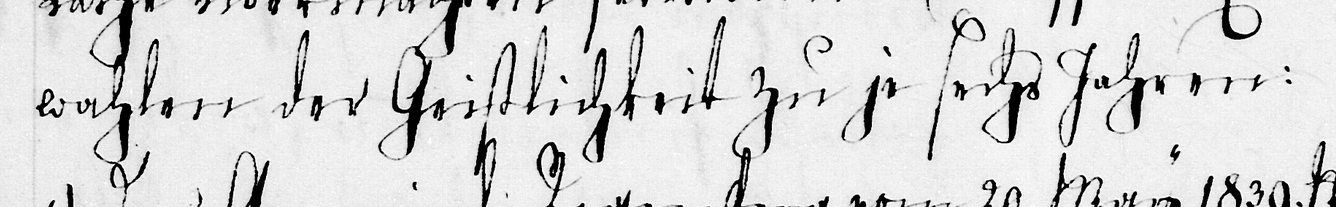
wahlen der Geistlichkeit zu je sechs Jahren:
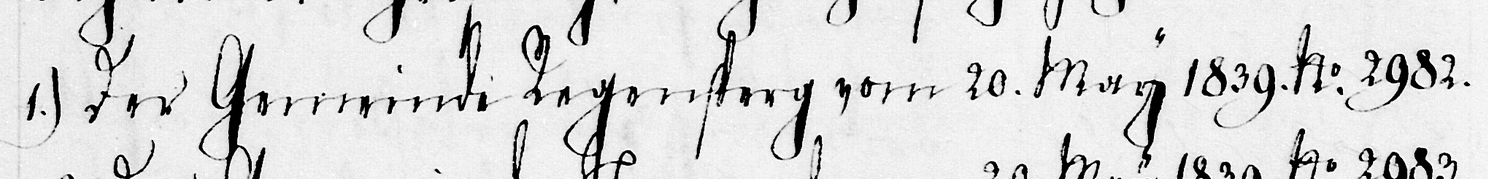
1.) Der Gemeinde Regensperg vom 20. May 1839. No. 2982.
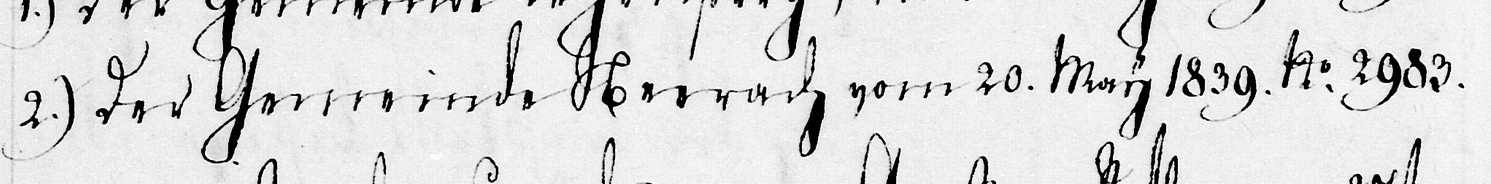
2.) Der Gemeinde Neerach vom 20. May 1839. No. 2983.
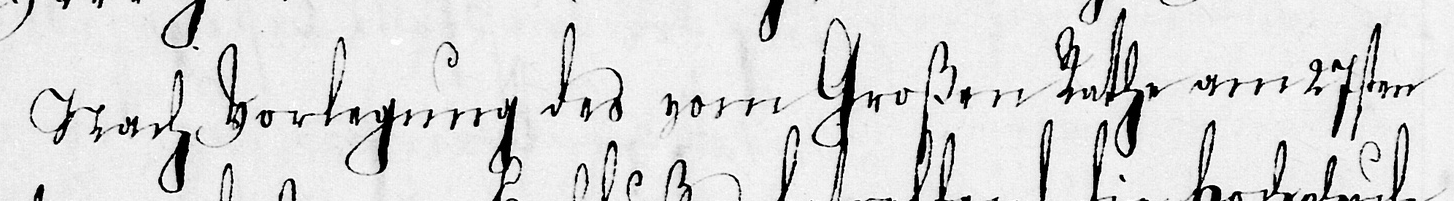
Nach Vorlegung des vom Großen Rathe am 27sten
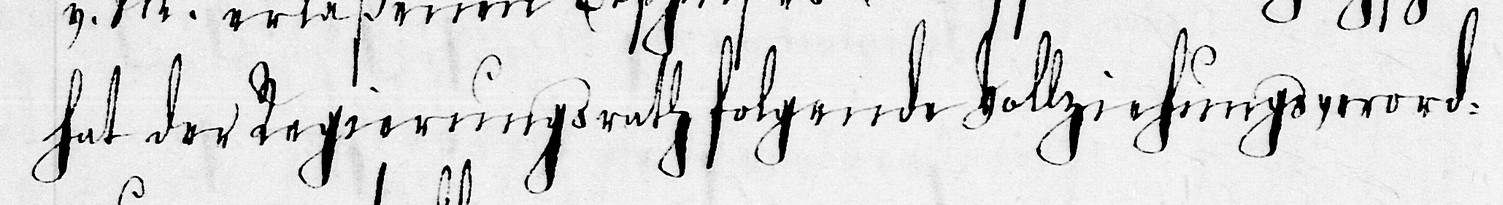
hat der Regierungsrath folgende Vollziehungsverord¬
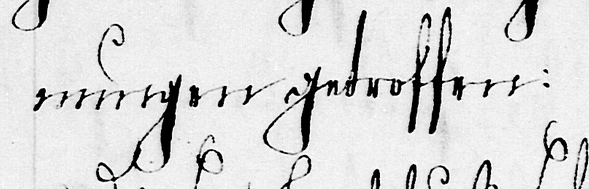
nungen getroffen:
